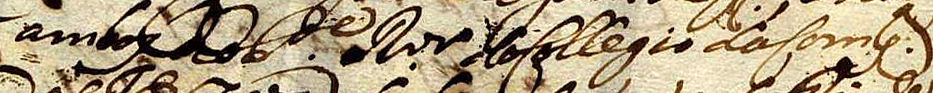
ambos ao P.e R.or do Collegio da Comp.a
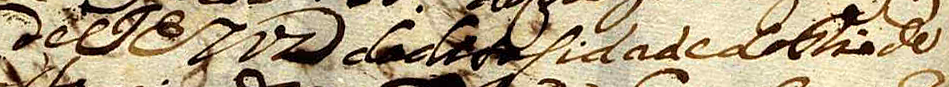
de IEZVZ da dita Cidade do Rio de
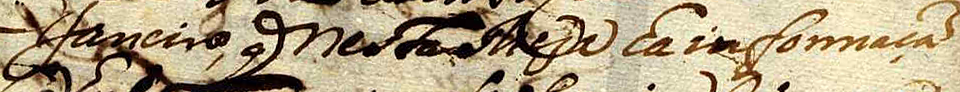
Janeiro, q̄ nesta Meza ha informaçā
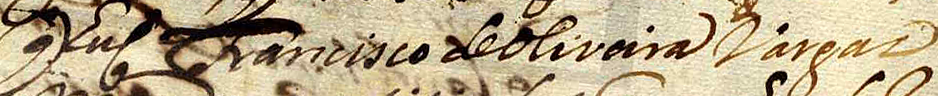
o hū Francisco de Oliveira Vargas
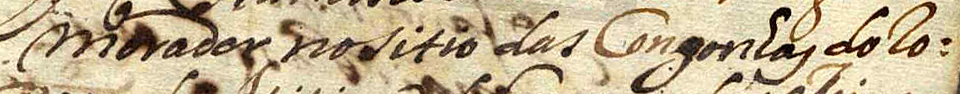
morador no sitio das Congonhas do Ro
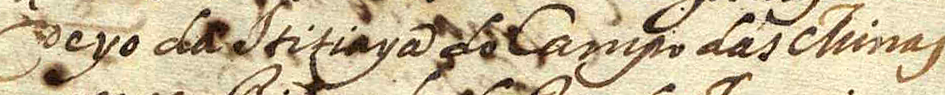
deyo da Ititiaya do Campo das Minas
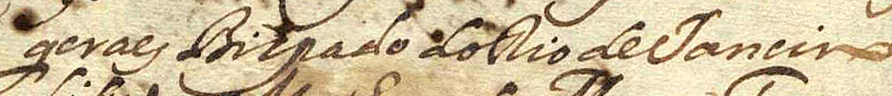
geraes Bispado do Rio de Ianeiro
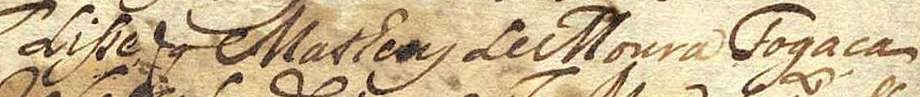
disse q̄ Matheus de Moura Fogaça
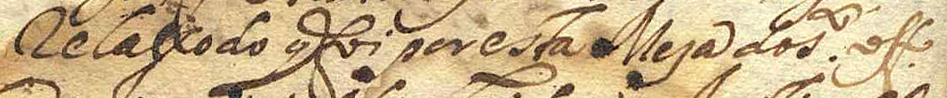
Relaxado q̄ foi por esta Meza do s.to off.o
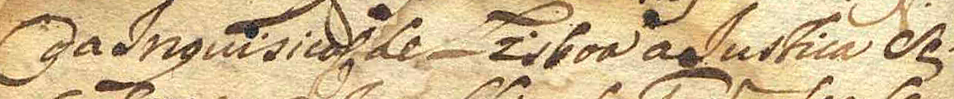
da Inquisiçaõ de Lisboa a Iustiça se
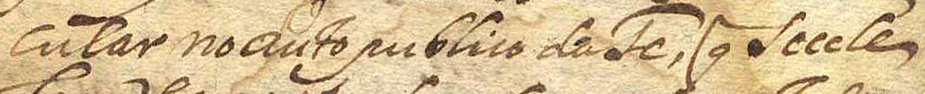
cular no auto publico da Fe, q̄ se cele
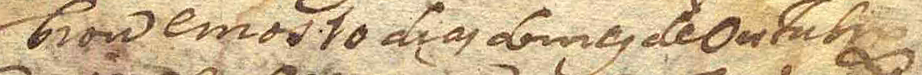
brou em os 10 dias do mes de Outubro
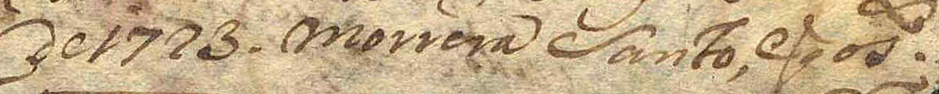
de 1723. morrera Santo, e q̄ o sto.
